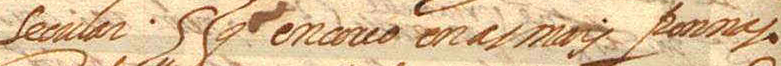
secular. E q̄ encoreo en as mais pennas
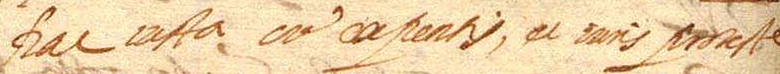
fiat iusta cū expensis, et iuris proteste
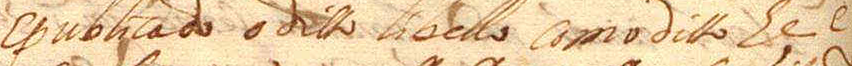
E publicado o ditto libello como ditto he e
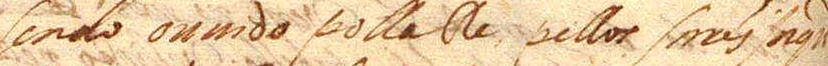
sendo ouuido polla Re pellos snres̄ Jnqure
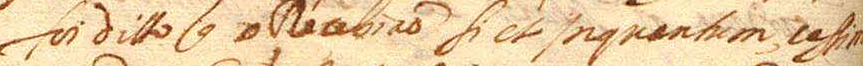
foi ditto q̄ o Recebiaõ si et jn quantum, e assim
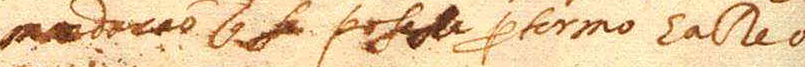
mandaraõ q̄ se posesse ꝓ termo E a Re o
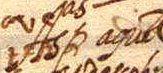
As pas a quē
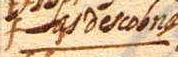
as descobrio
